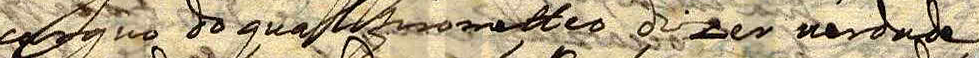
carguo do qual prometteo dizer verdade,
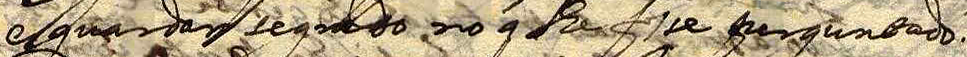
e guardar segredo no q̄ lhe fosse perguntado.
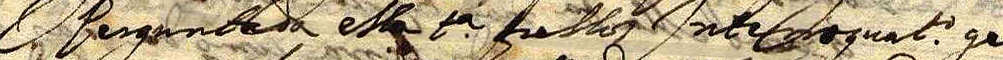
Perguntada ella t.a pellos Jnterroguat.o ge
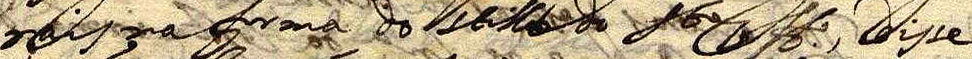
rais na forma do stillo do Sto off.o, disse
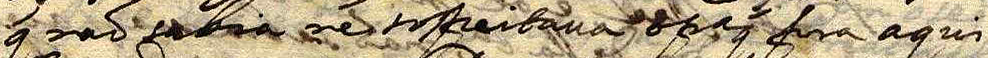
q̄ naõ sabia nē sospeitaua o paq̄ fora aqui
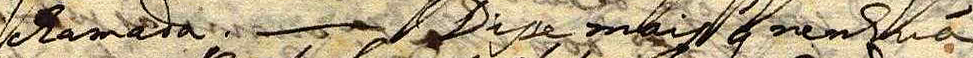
chamada. Disse mais q̄ nenhuā
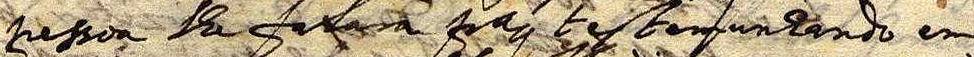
pessoa lhe falara paq̄ testemunhando em
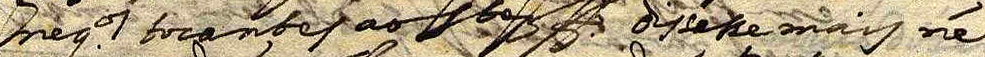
neg.os tocantes ao Sto off.o dissesse mais nē
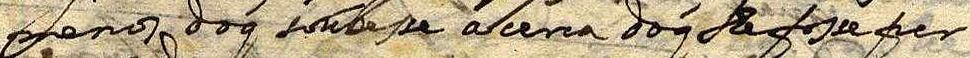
menos do q̄ soubesse acerca do q̄ lhe fosse per
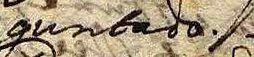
guntado.//
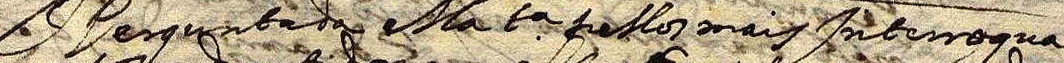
Perguntada ella t.a pellos mais Jnterrogua
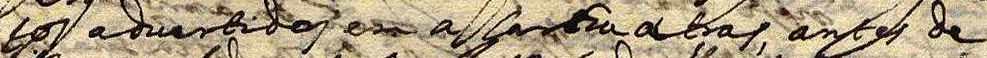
t.os aduertidos em a carta atras, antes de
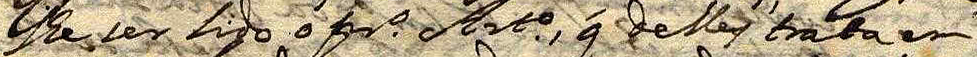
lhe ser lido o pr.o Ant.o, q̄ delles trata em
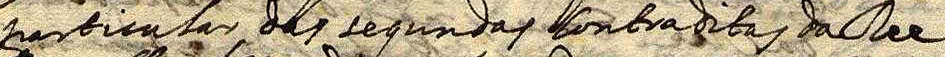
particular das segundas contraditas da Ree
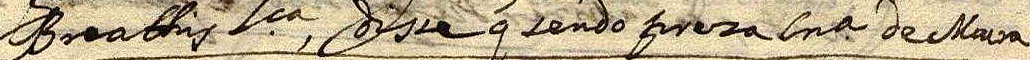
Breathis L.ca, disse q̄ sendo preza Cn.a de Moura
